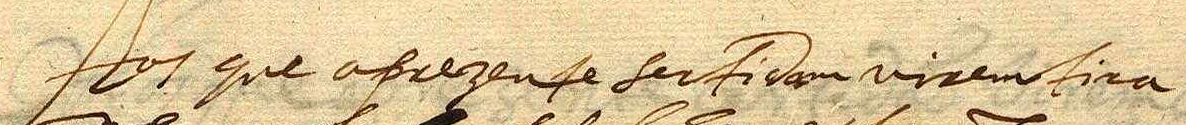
Aos que a prezente sertidam virem tira
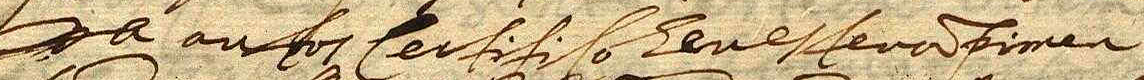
da autos CertifiCo heu estevaõ pimen
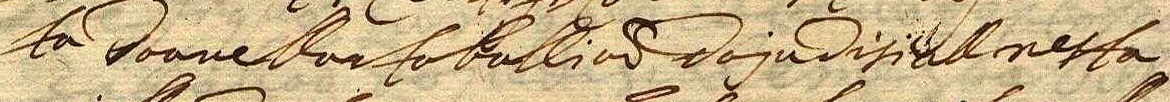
ta do auellar taballiaõ do judisiall nesta
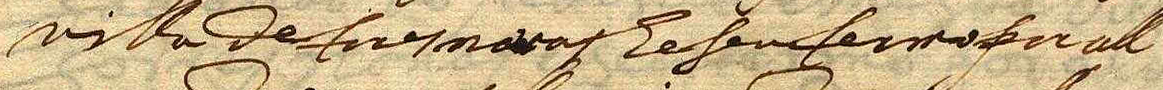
villa de tores novas he seu termo por all
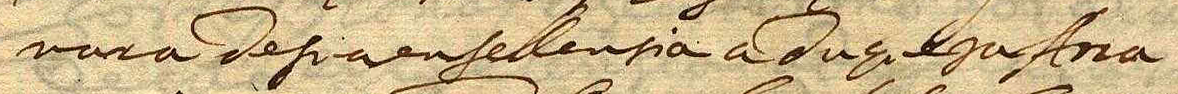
vara de sua ensellensia a duqueza Ana
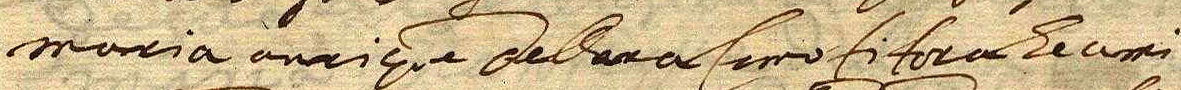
maria anrique de llara Como titora he ami
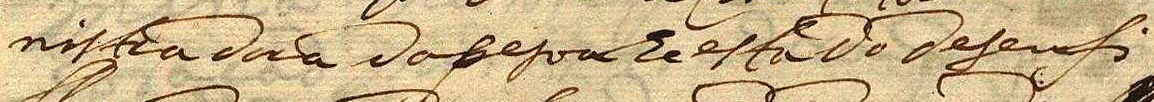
nistradora da pesoa he estado de seu fi
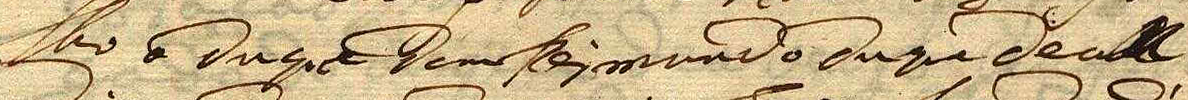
lho o duque dom Rajmundo duque de all
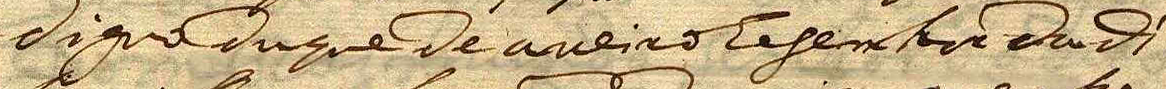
diguo duque de aueiro he senhor da di
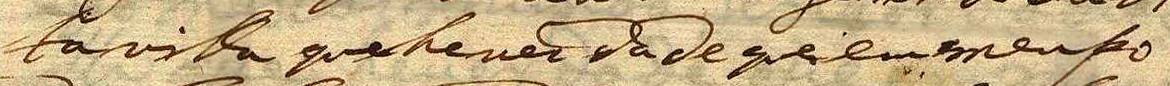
ta villa que he uerdade que em meu po
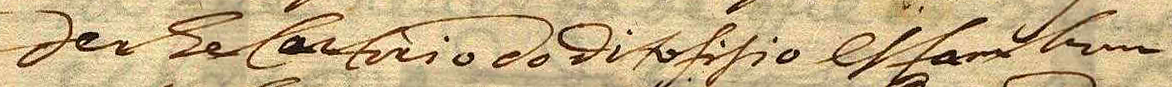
der he Cartorio do ditofisio estam hum
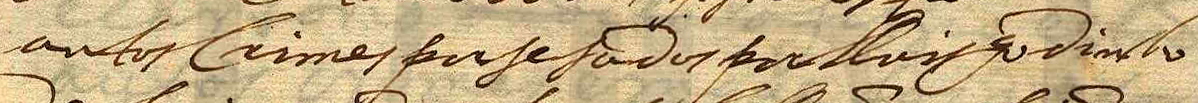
autos Crimes porsesados por lluis godinho
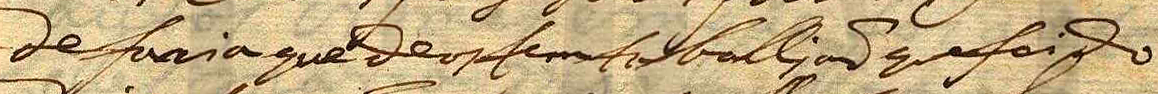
de faria que deos tem taballjaõ que foi do
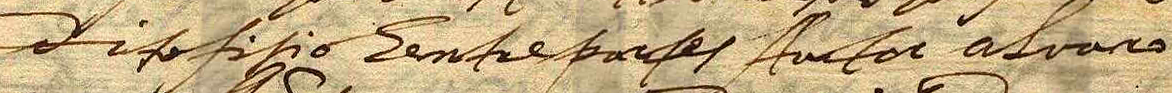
ditofisio hentre partes Autor alvaro
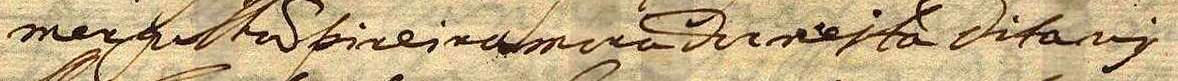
margulhaõ pireira morador nesta dita vy
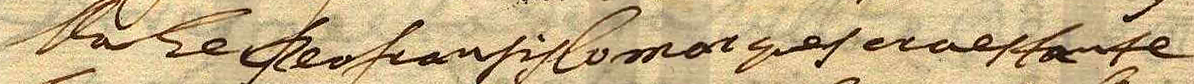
lla he Reo fransisCo marques ora estante
